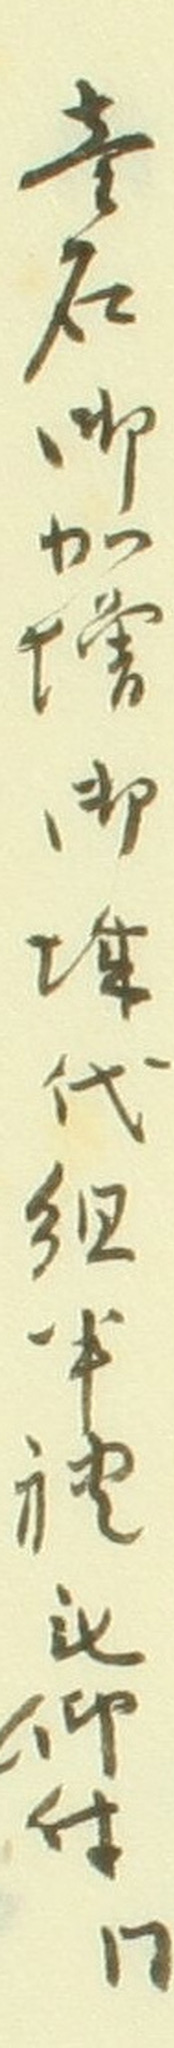壱石御加増御城代組半礼被仰付同
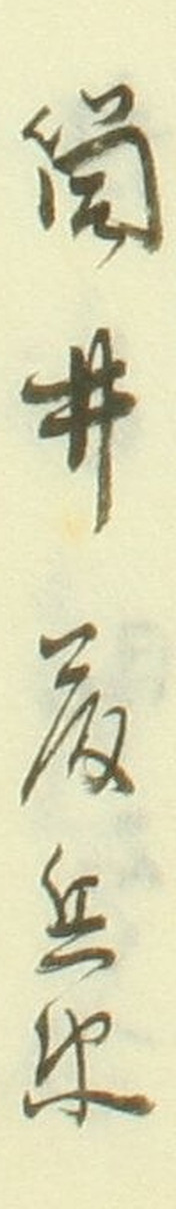筒井籐兵衛
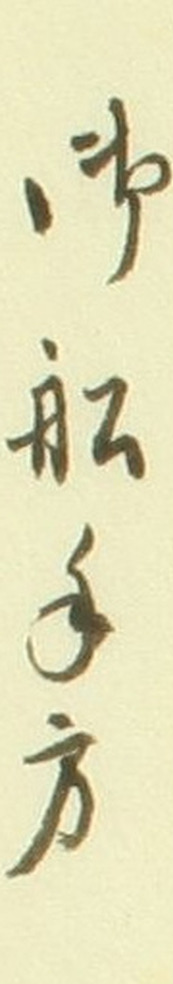御船手方
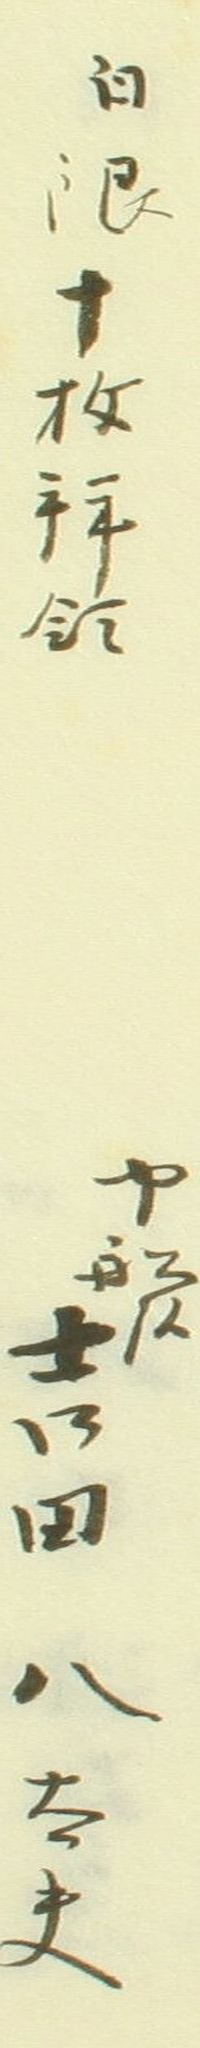白銀十枚拝領中船頭吉田八大夫
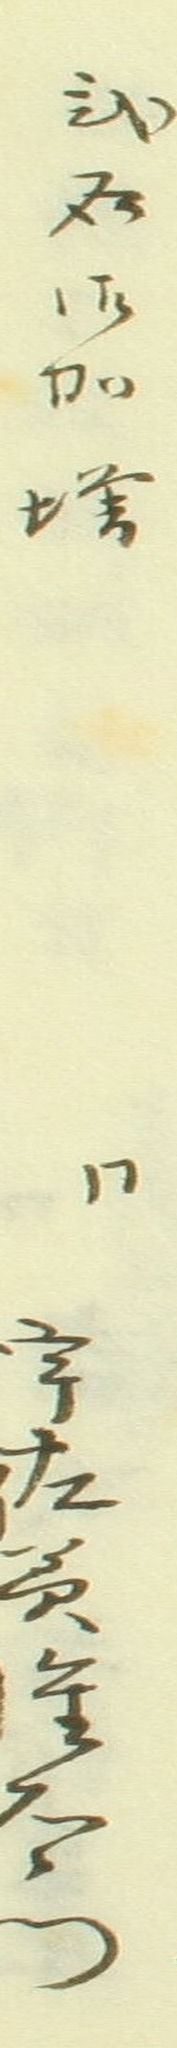弐石御加増同宇佐美権右衛門
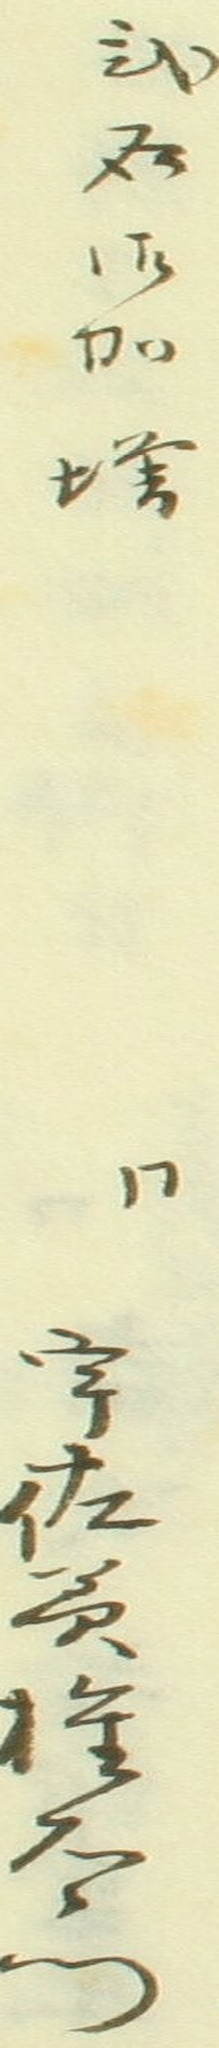弐石御加増同宇佐美権右衛門
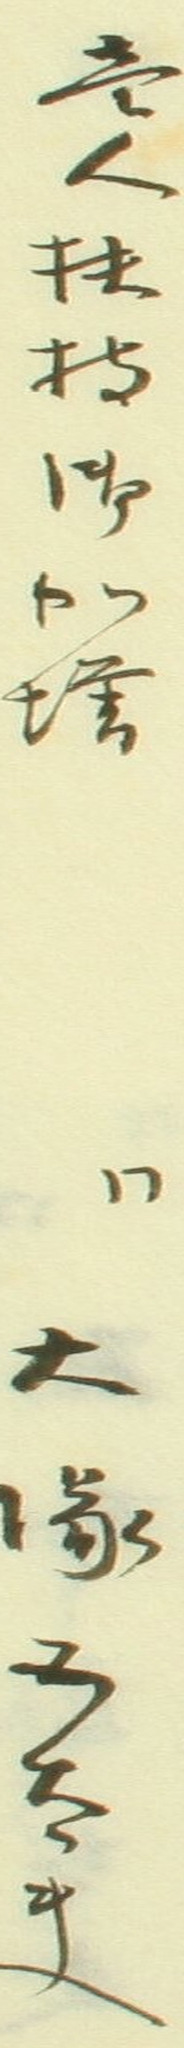壱人扶持御加増同大塚五太夫
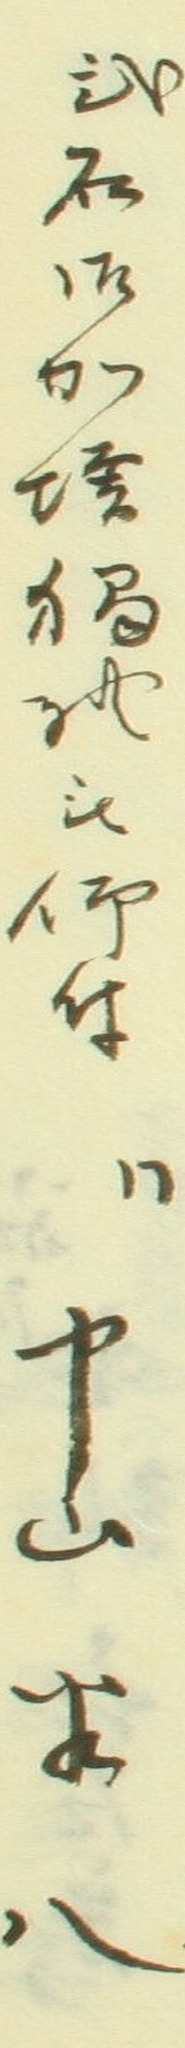弐石御加増獨礼被仰付同中山半八

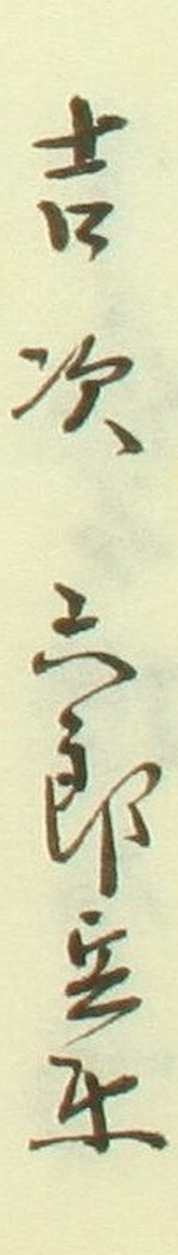同吉次六郎兵衛
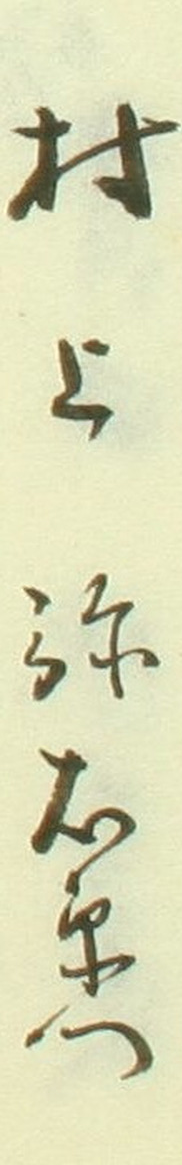同村上弥右衛門
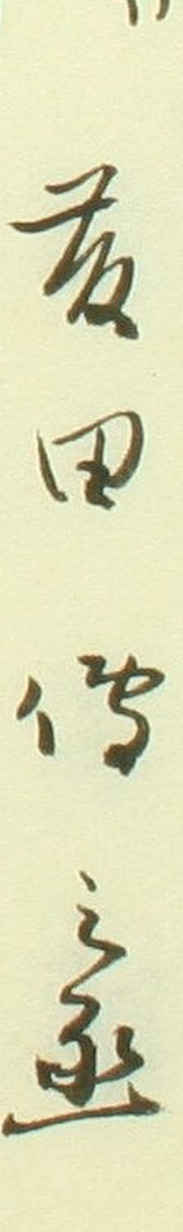同藤田伝之丞
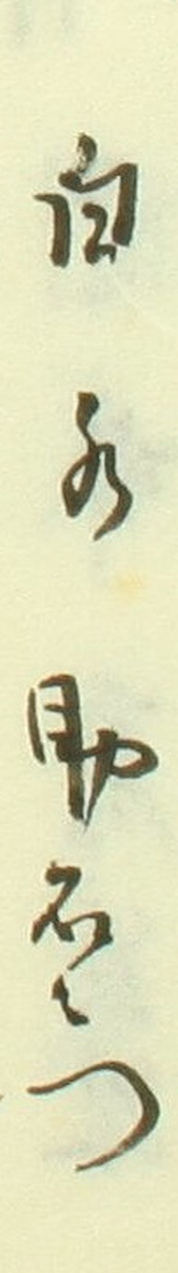同白水助右衛門
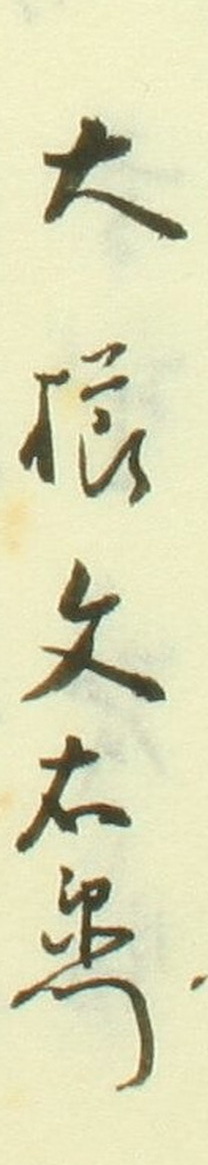同大様文右衛門
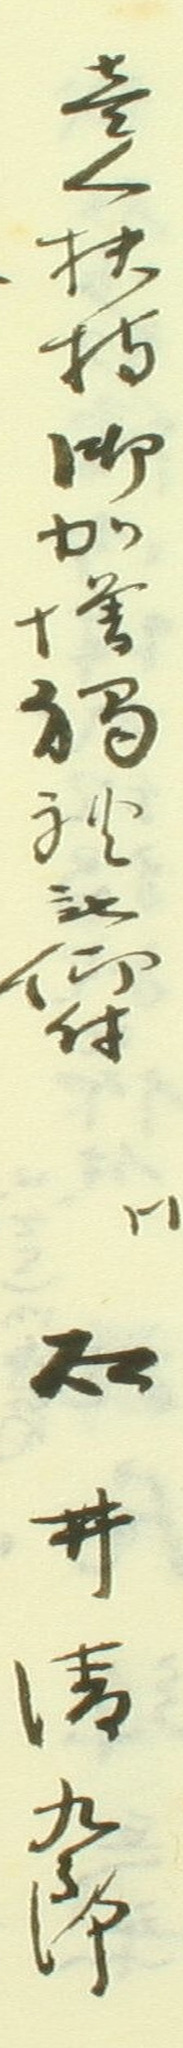壱人扶持御加増獨礼被仰付同石井清九郎
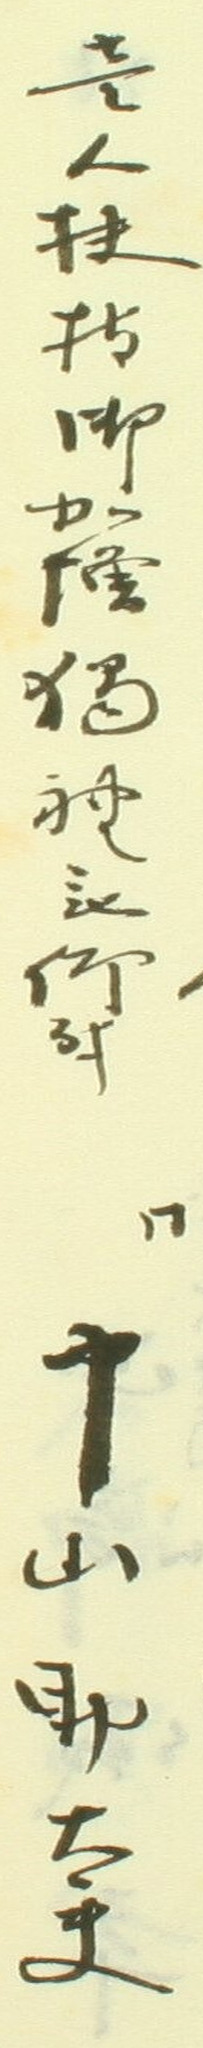壱人扶持御加増獨礼被仰付同中山助太夫
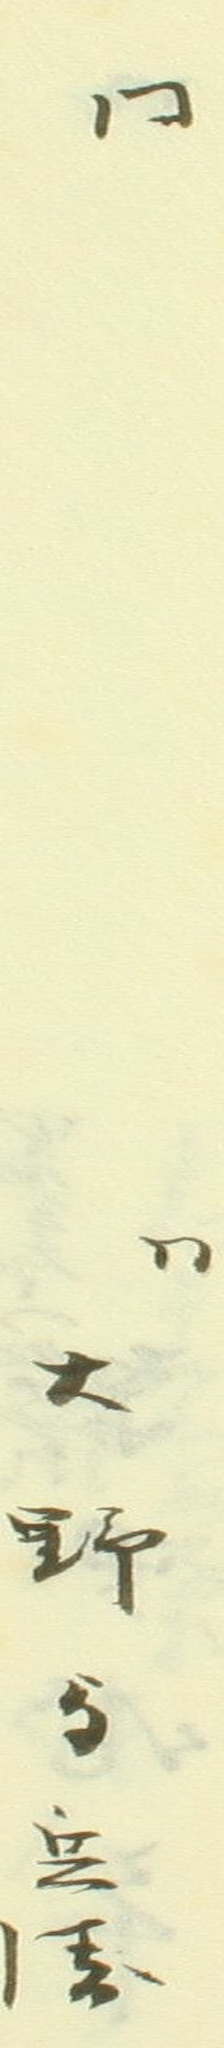同同大野与兵衛
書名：唐船漂流記 三
